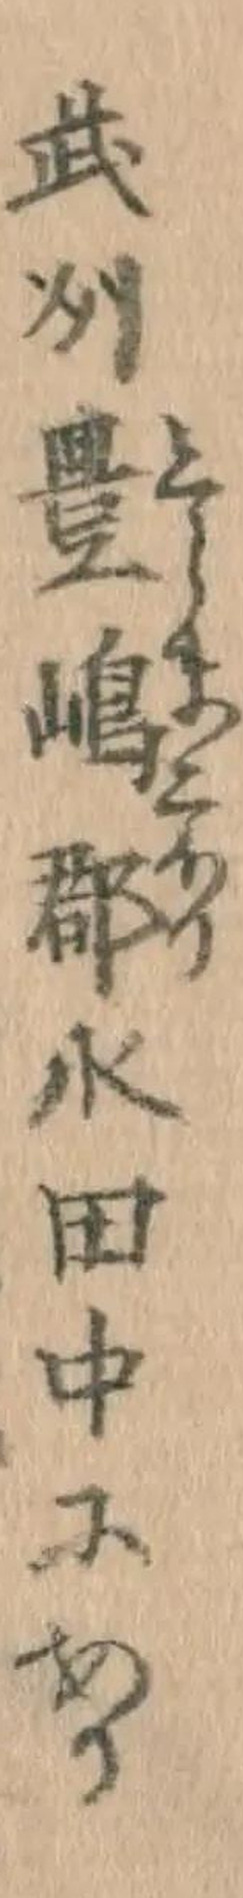武州豊嶋郡水田中にあり
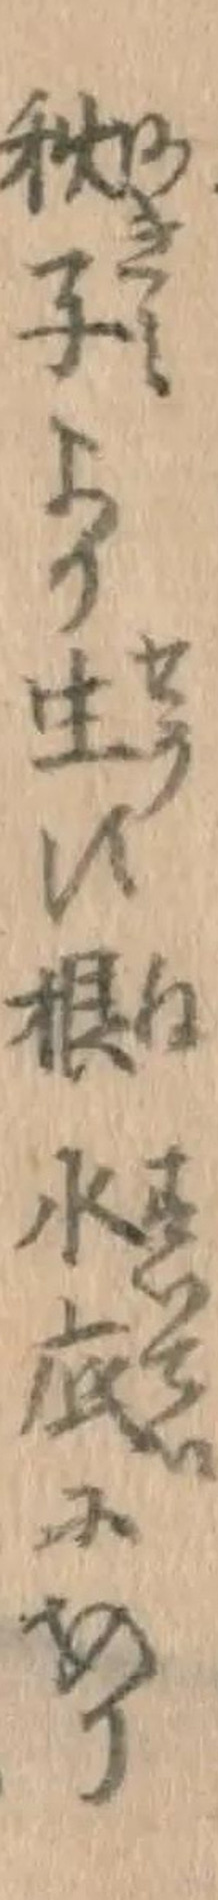秋子より生す根水底にあり
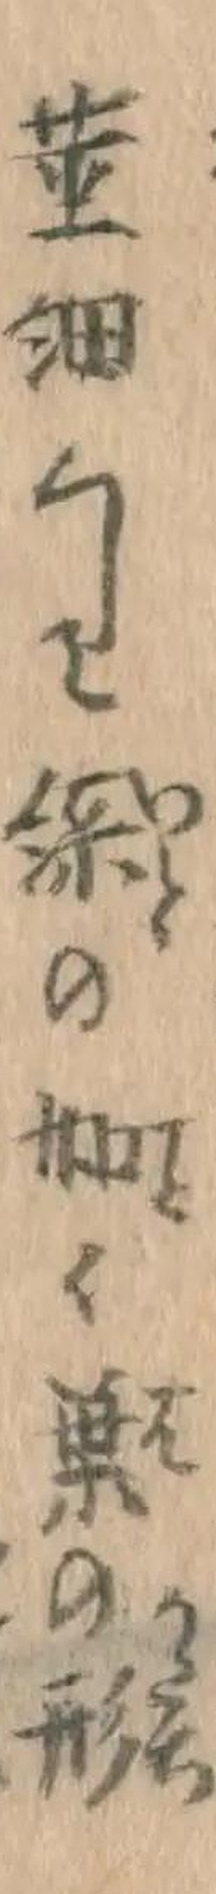茎細くして糸の如く葉の形
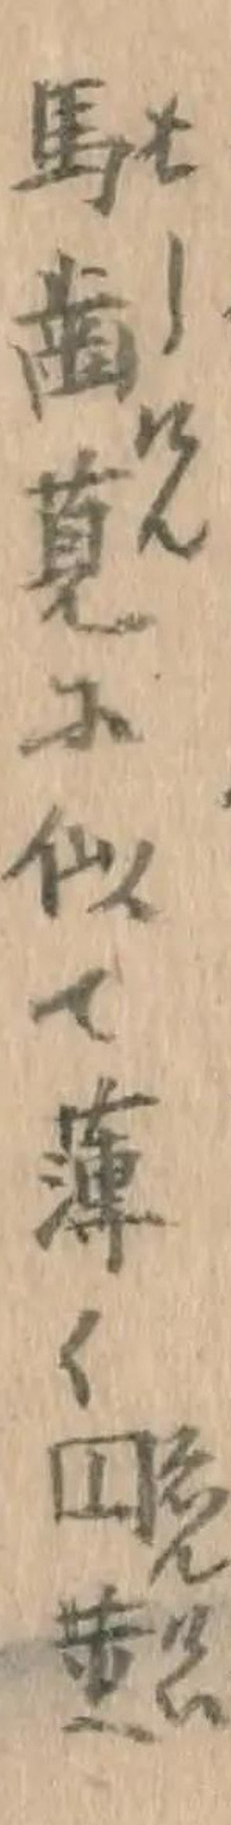馬歯莧に似て薄く円茎
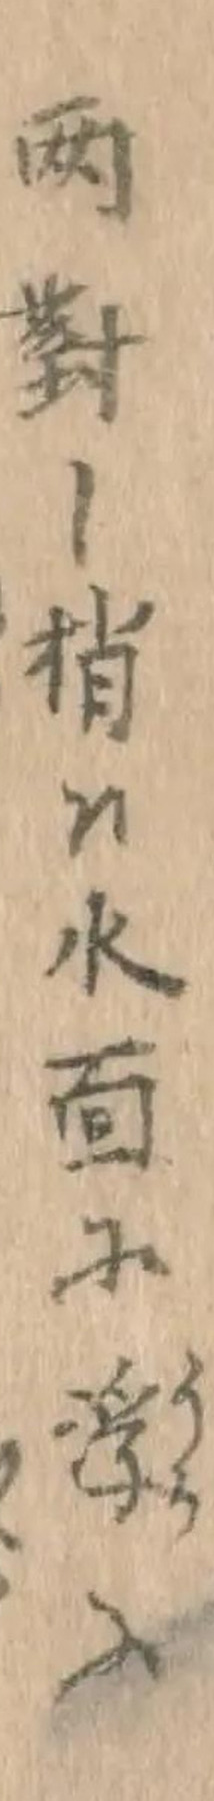両対し梢は水面に浮ふ
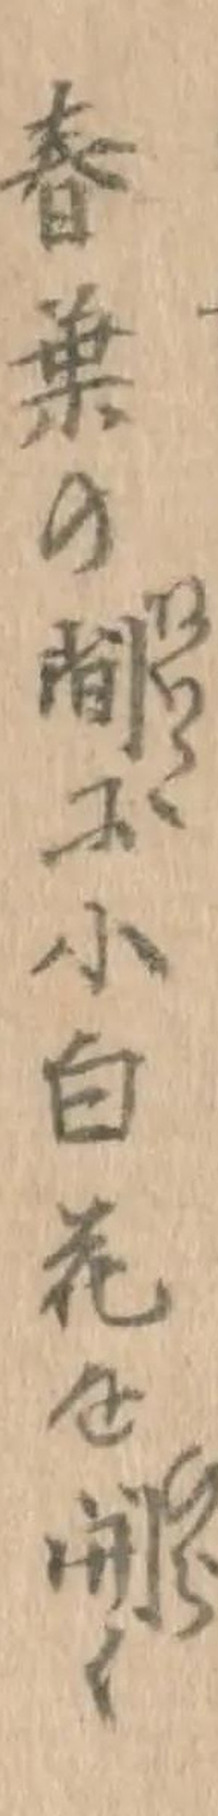春葉の間に小白花を開く
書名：本草図譜. 巻46-48
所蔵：国立国会図書館 National Diet Library, JAPAN
